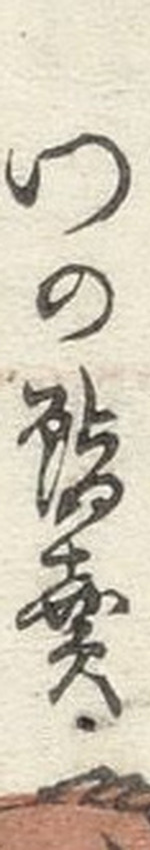門の鮨売
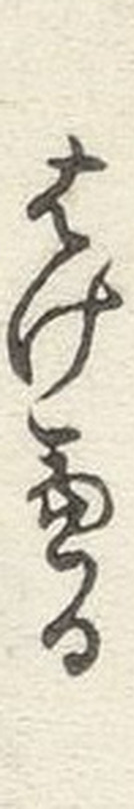はけ兼る
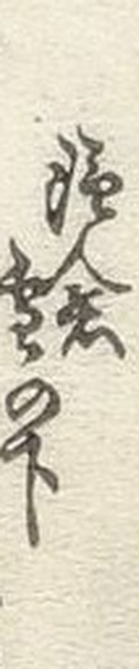雪の下
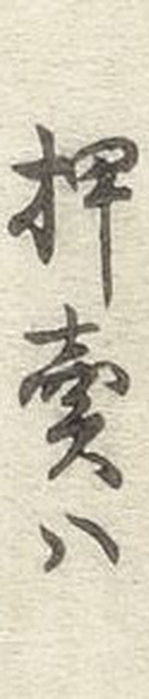押売は
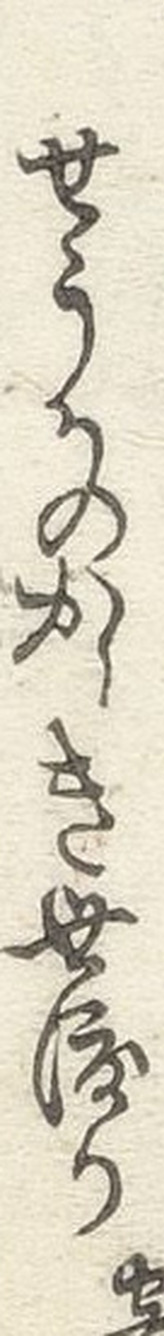せうかのからき世渡り
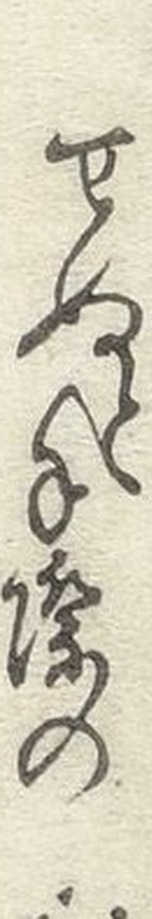せぬと手際の
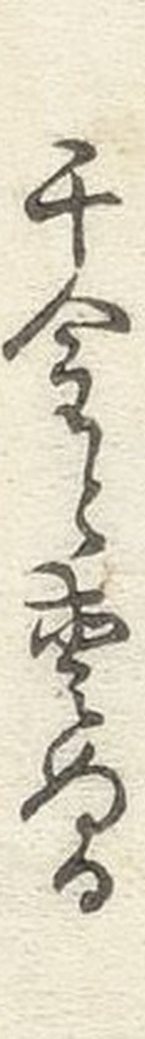千金と愛ぬる
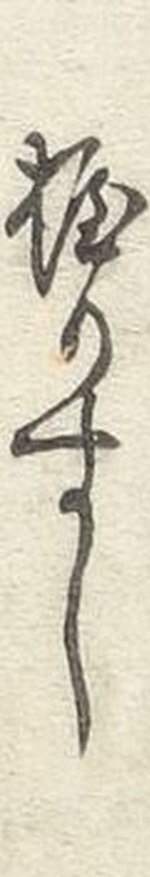握りすし
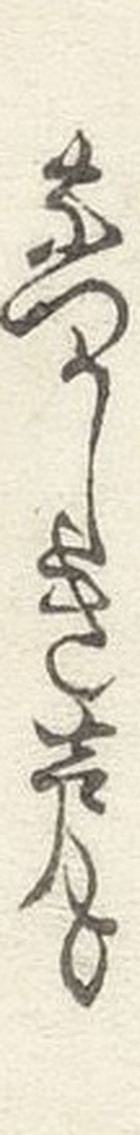なつかしき声も
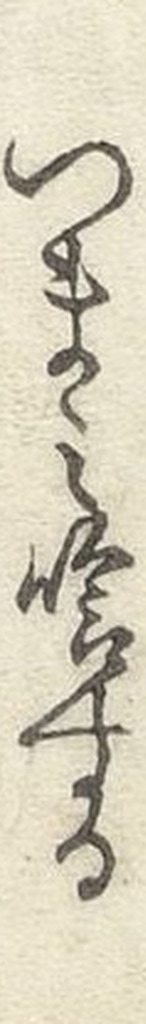つまみ喰する
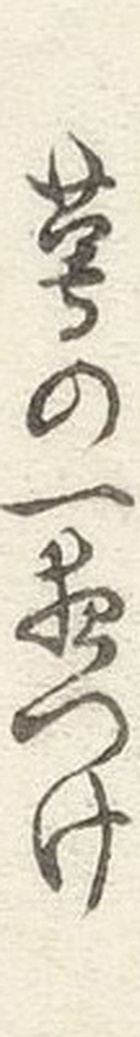萼の一夜つけ
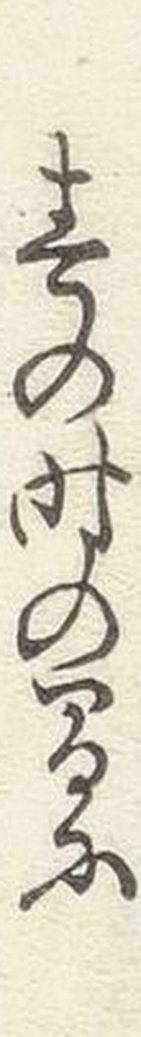春の時の間に
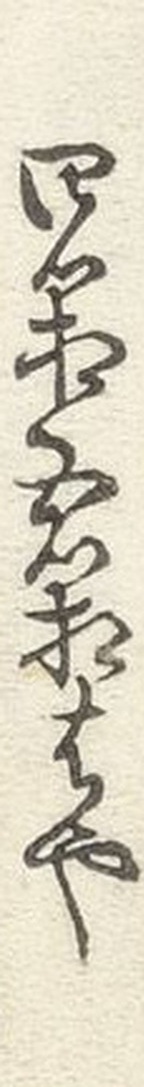四箱五箱はや
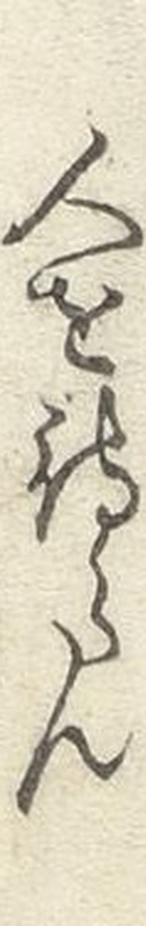人を待らん
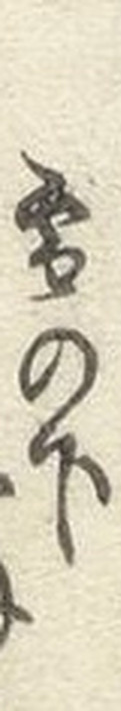雪の下
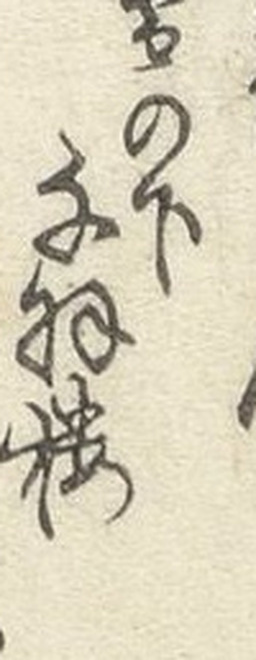千羽楼
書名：Picture Album of People with Kyōka (Light Verse) (Kyōka shiki jinbutsu 狂歌四季人物)
